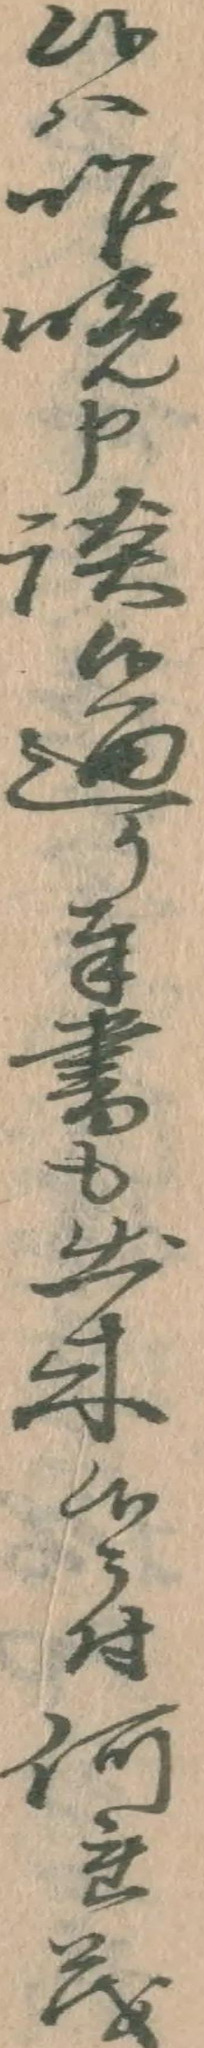候は昨晩申談候通り奉書も出来候に付何連茂
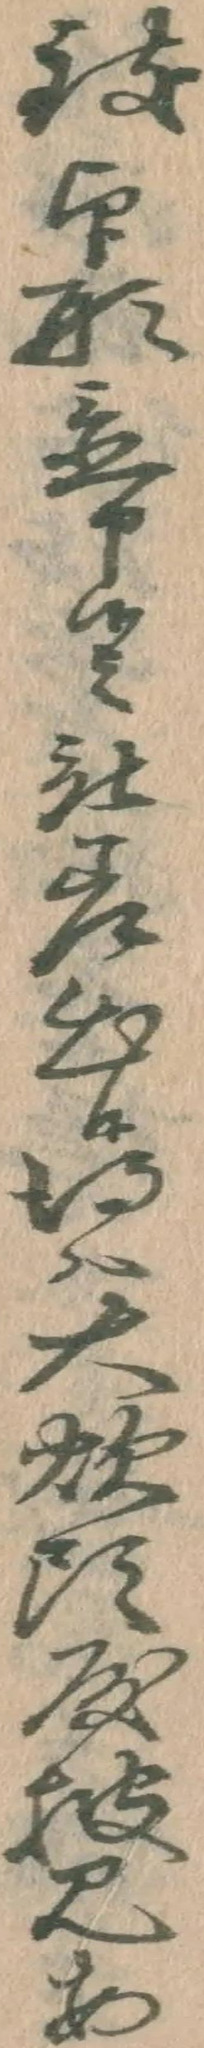致印形置申候て被差出候得は大炊頭殿披見あ
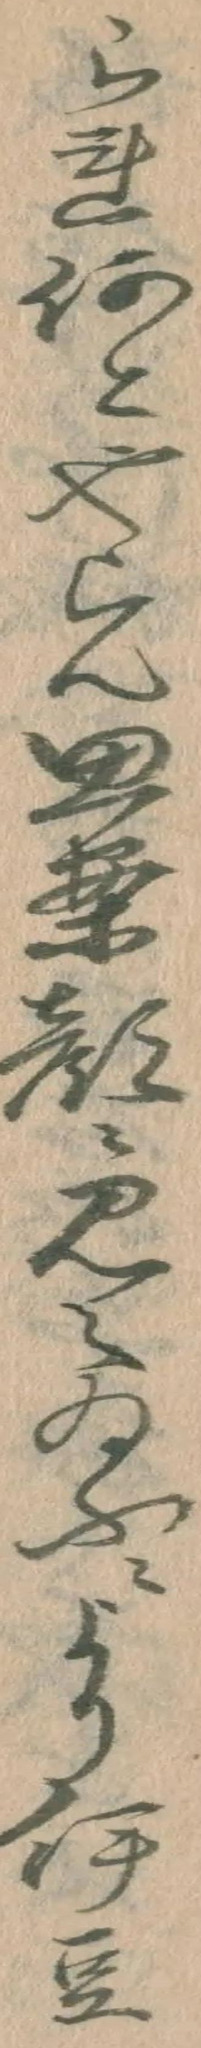ら連何とやらん思案顔に見之ゐふにより伊豆
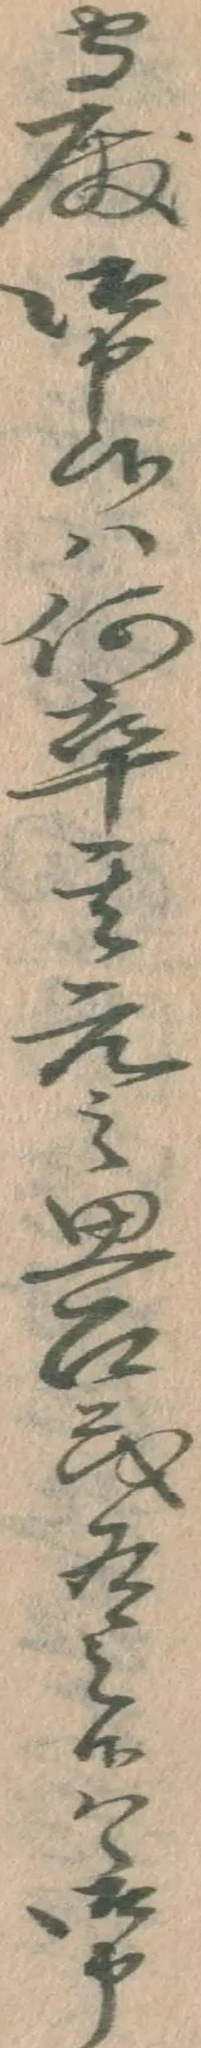守殿御申候は何卒其元之思召茂有之候はゝ御申
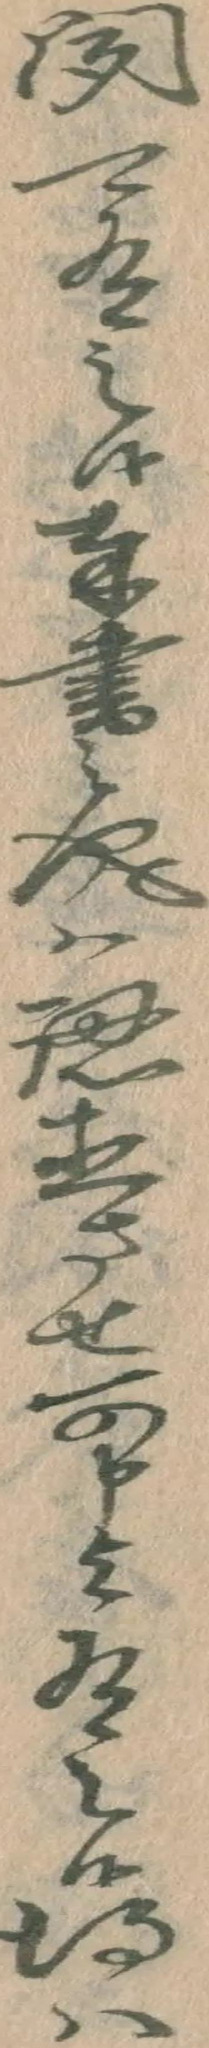聞可有之候奉書之儀は認置させ可申と有之候得は
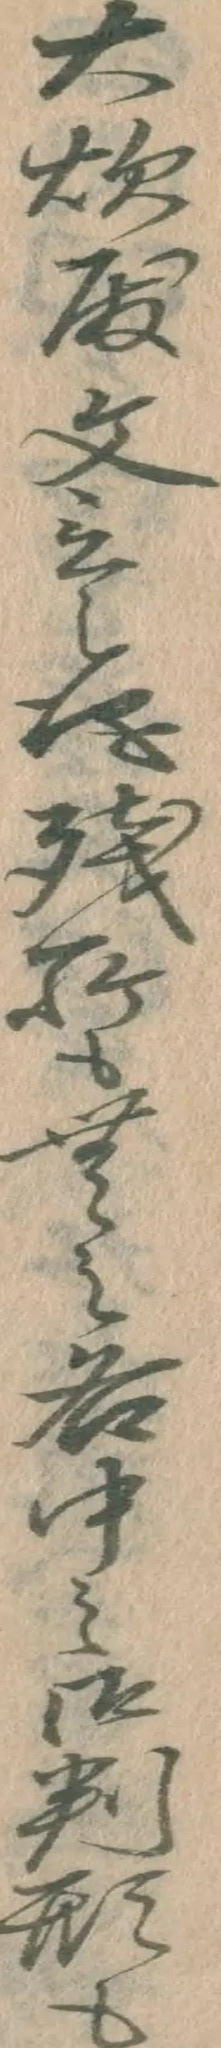大炊殿文云し儀残所も無之各中之御判形も
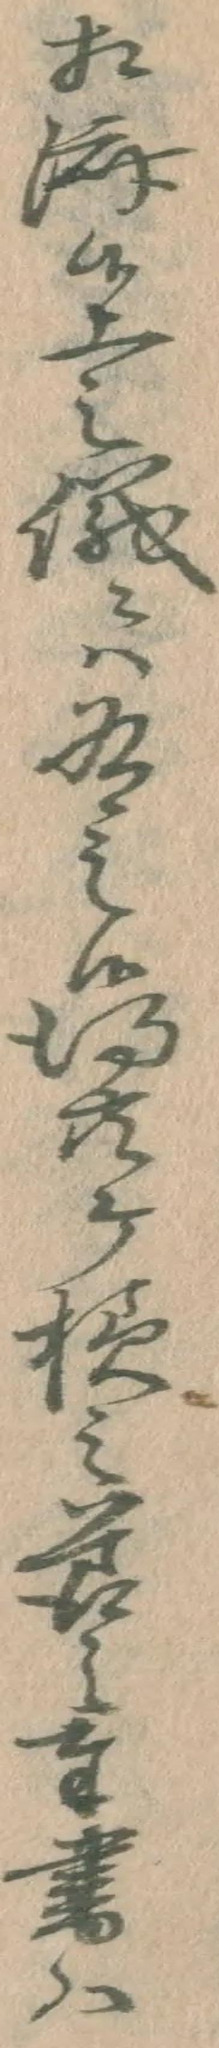相済候上之儀には有之候得共け様之節之奉書は
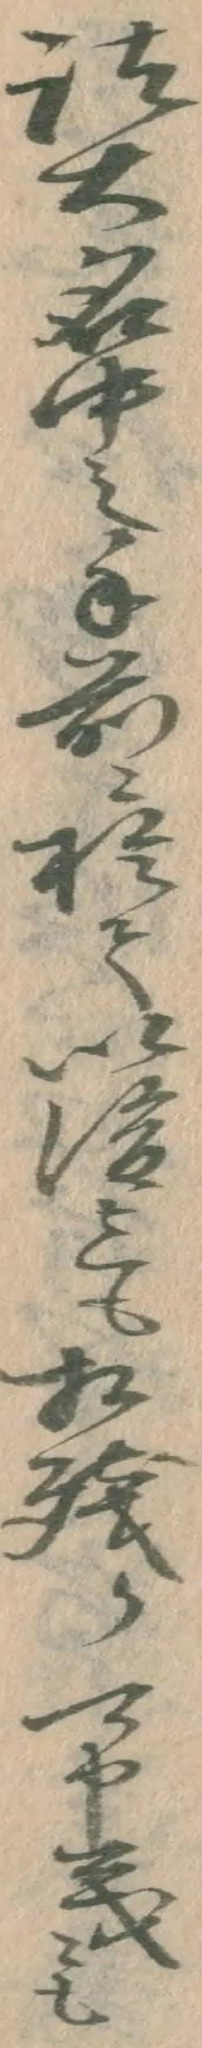諸大名中之手前に於て以後与も相残り可申義にも
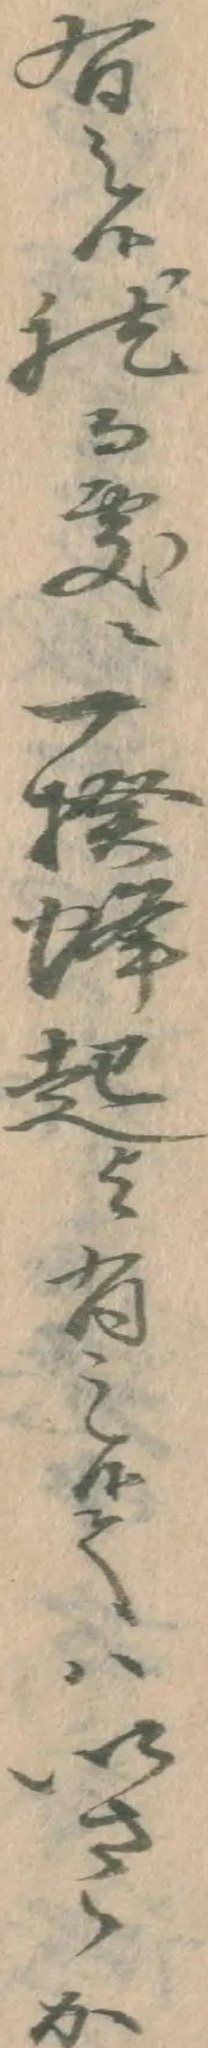有之候然る處に一揆蜂起与有之候ては以さゝか
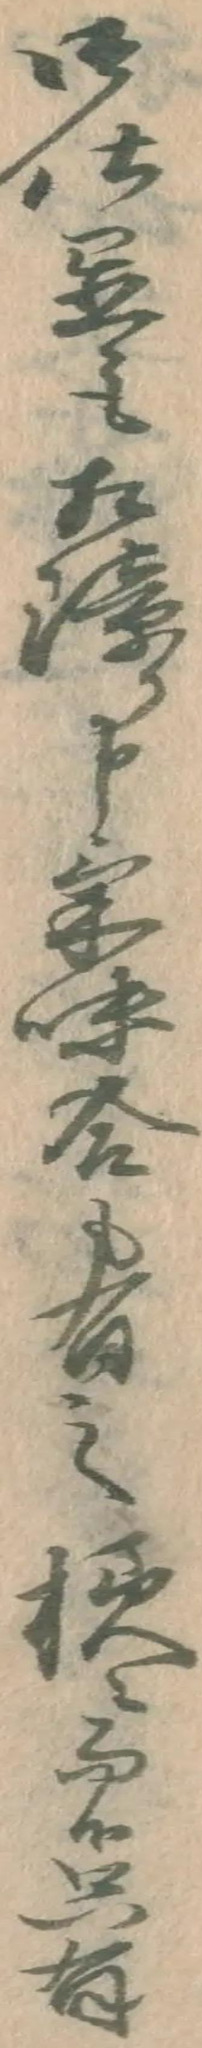御仕置も相障り申気味合も有之様に而候只有

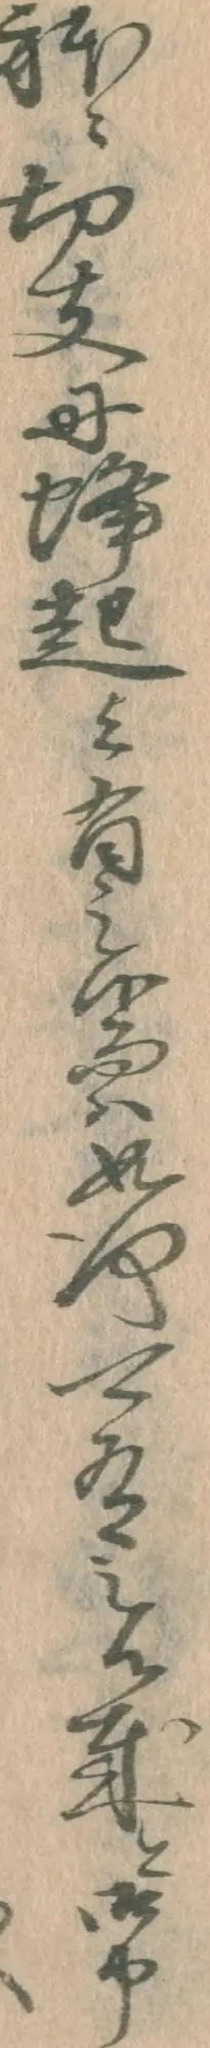躰に切支丹蜂起に有之候而は如何可有之候成と御申
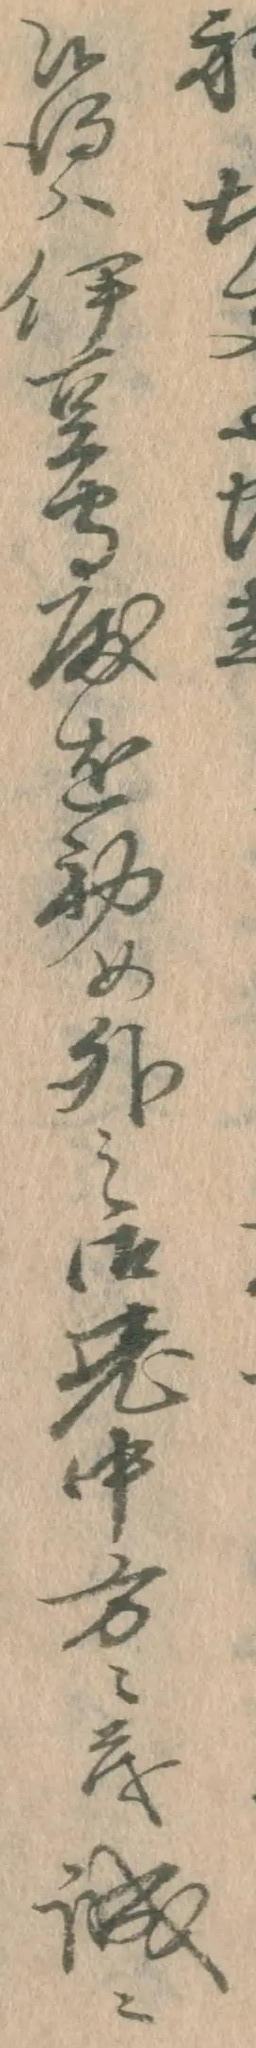候得は伊豆守殿を初め外之御老中方に茂誠に
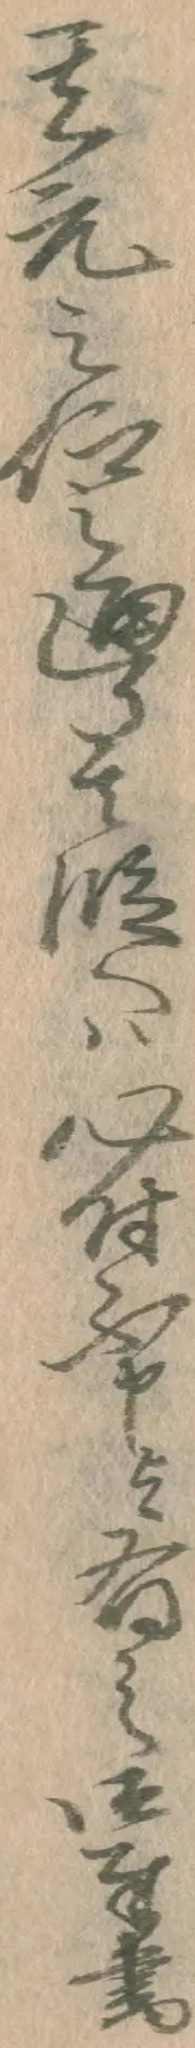其元之仰之通り其段へは心付不申と有之御奉書
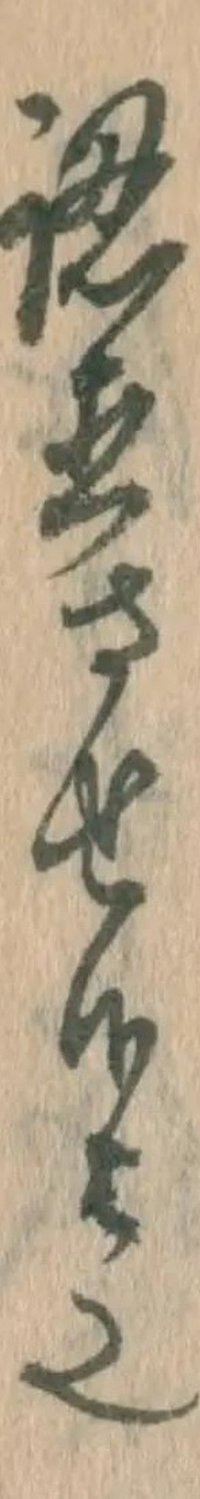認直させ候与也
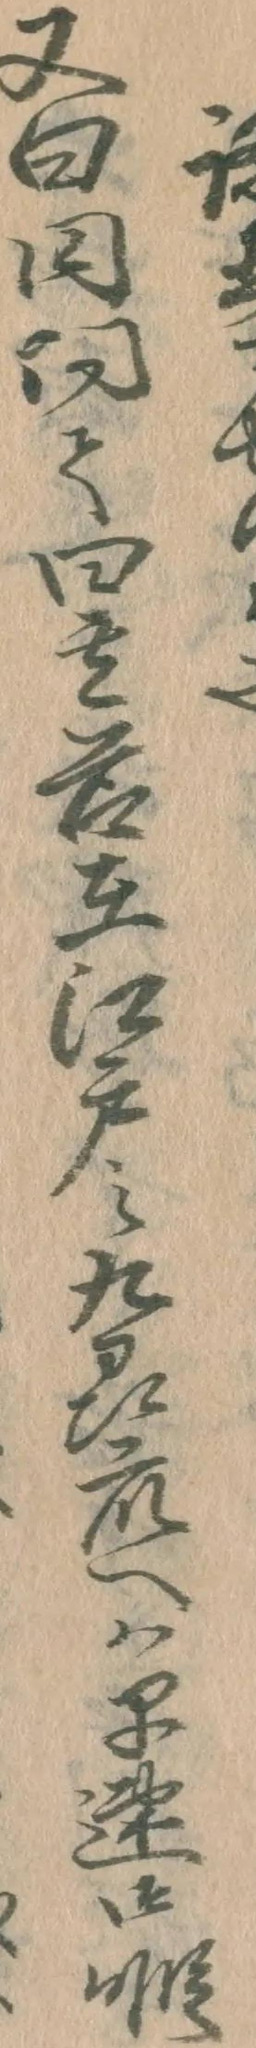又曰同伺て曰其節在江戸之九州衆へは早速御暇
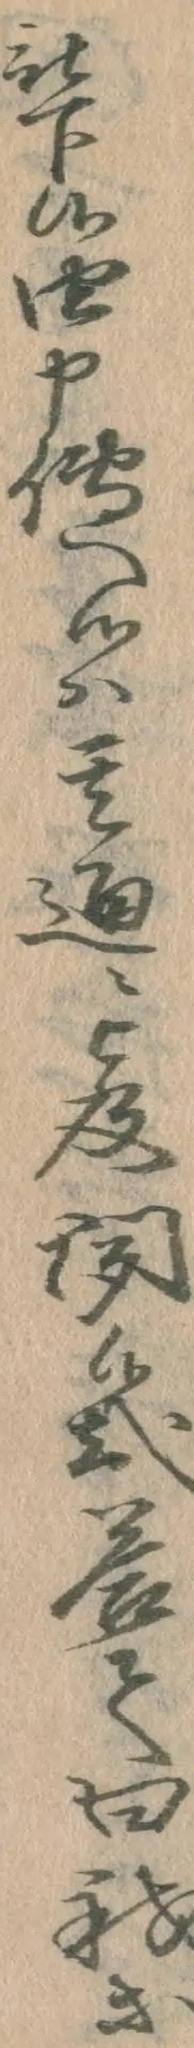被下候由申伝へ候は其通に被及聞候哉答て曰我等
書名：切支丹御退治記 49巻. [2]
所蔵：国立国会図書館 National Diet Library, JAPAN
